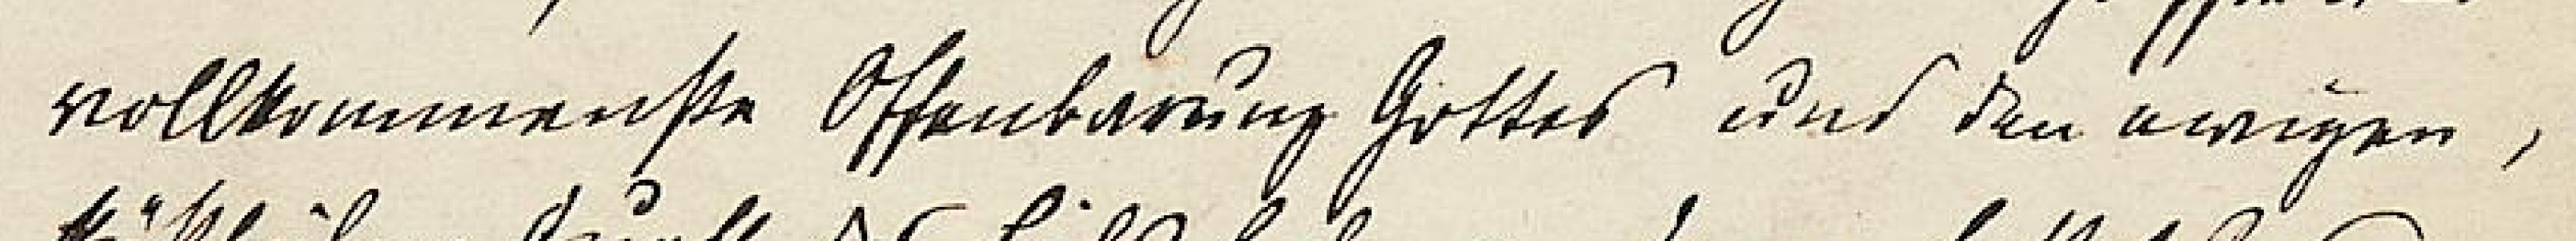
vollkommenste Offenbarung Gottes und den ewigen,
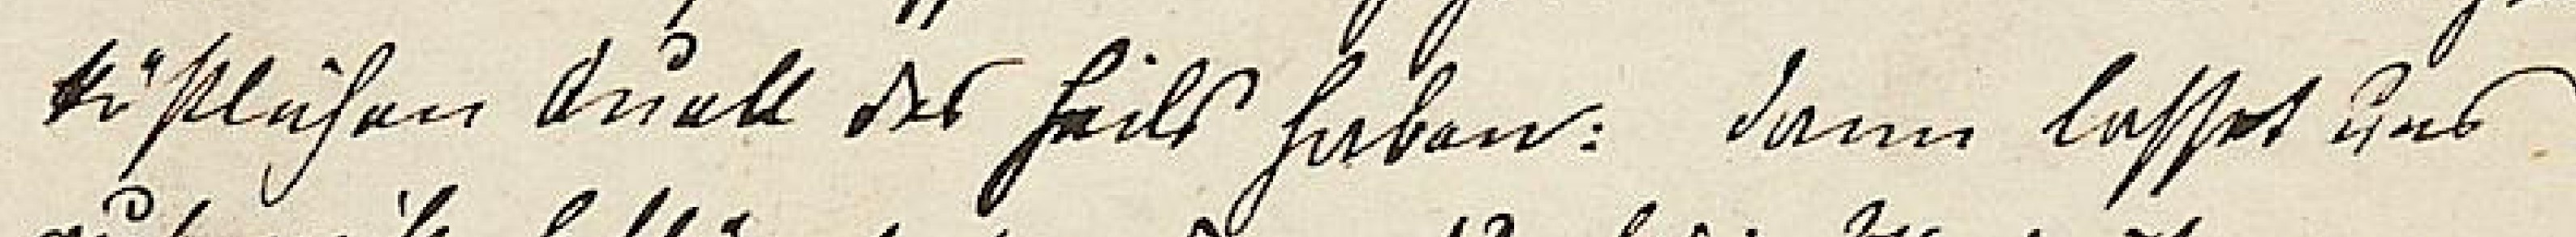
köstlichen Quell des Heils haben: dann lesset uns
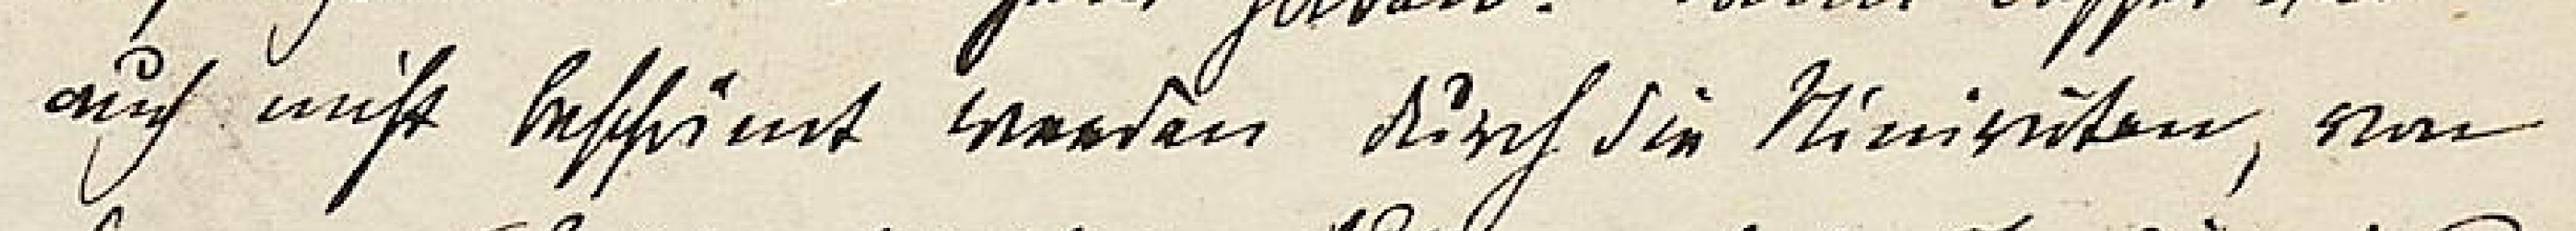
auch nicht beschämt werden durch die Niniviten, von
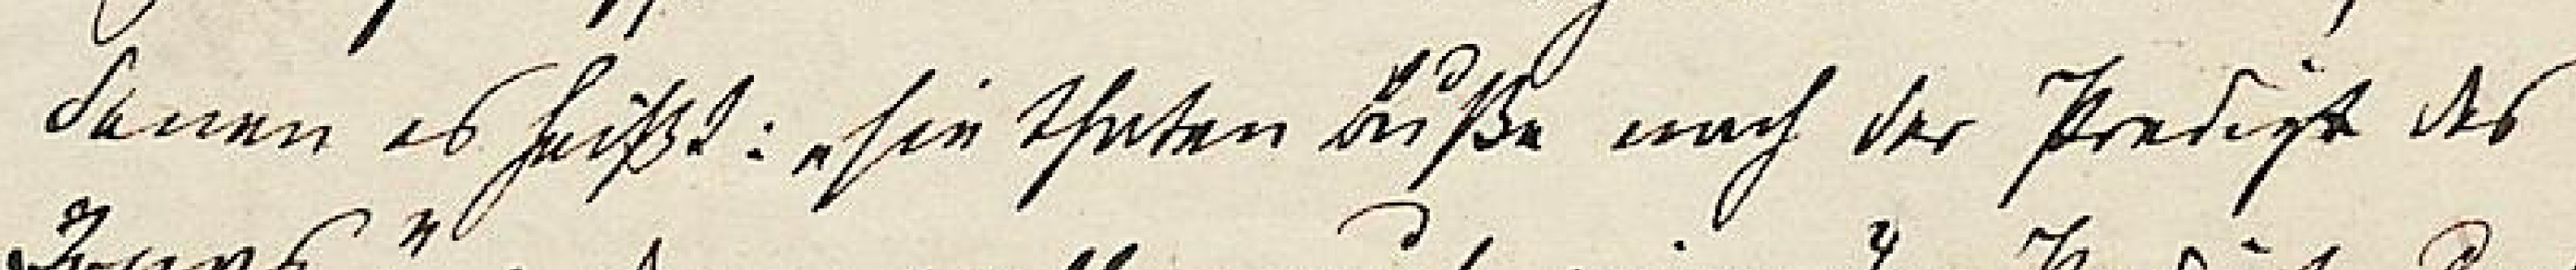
denen es heißt: "sie thaten Buße nach der Predigt des
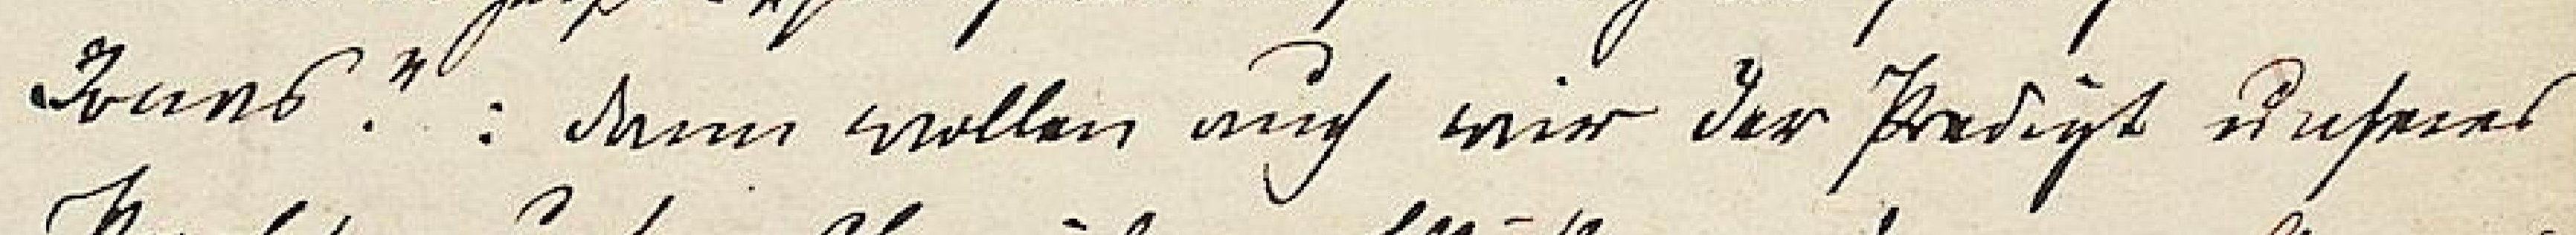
Jonas.": dann wollen auch wir der Predigt unseres
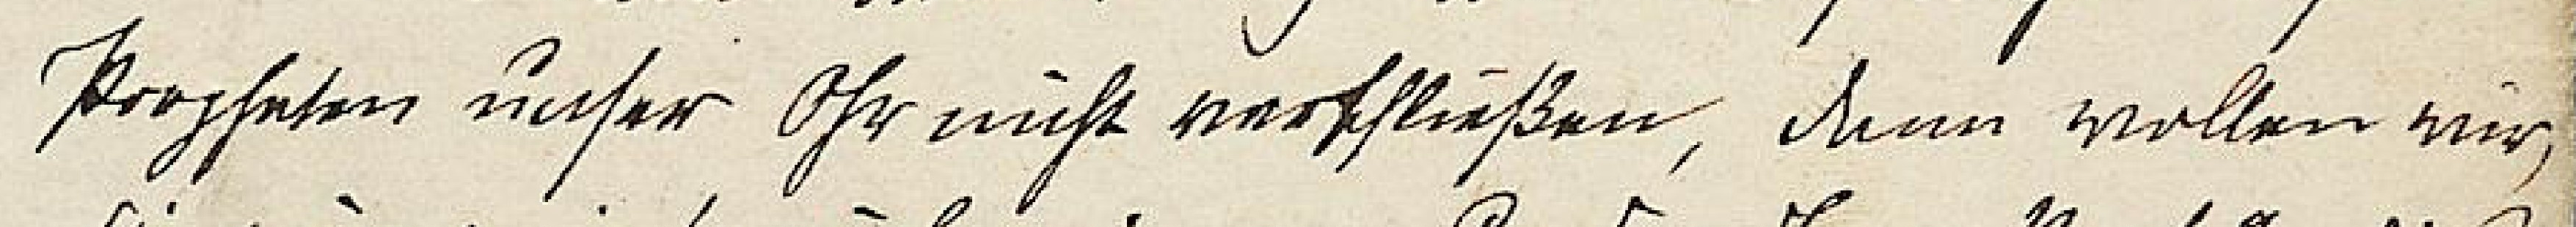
Propheten unser Ohr nicht verschließen, dann wollen wir,
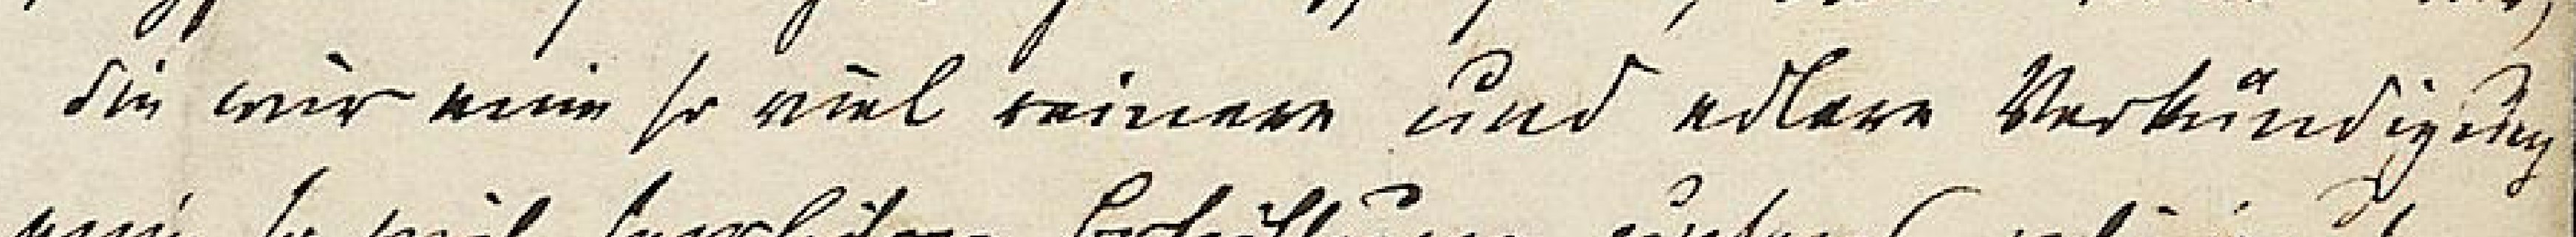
die wir eine so viel reinere und edlere Verkündigung
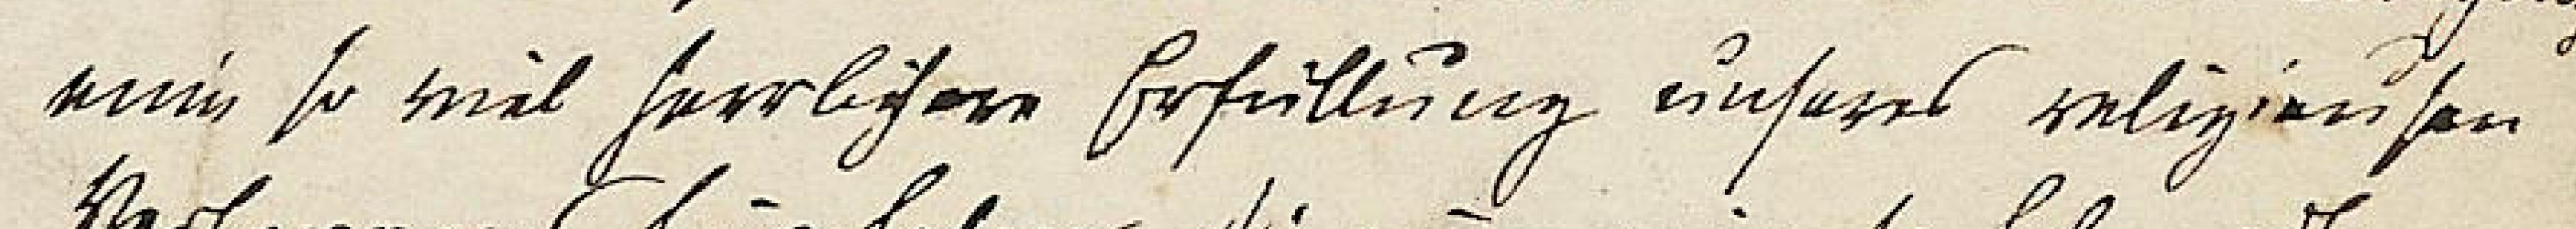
eine so viel herrlichere Erfüllung unseres religieusen
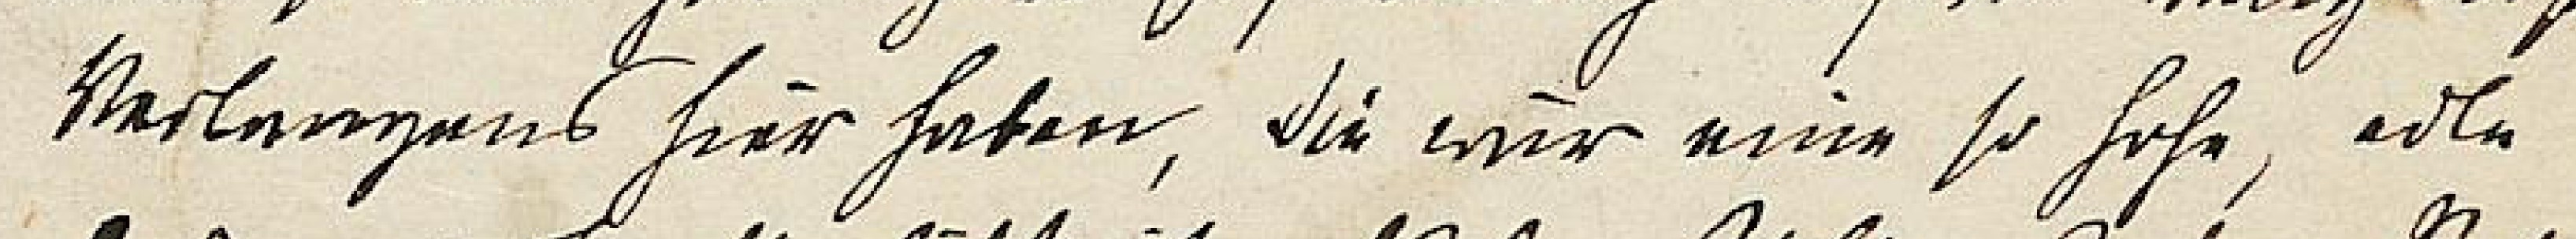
Verlangens hier haben, die wir eine so hohe, edle
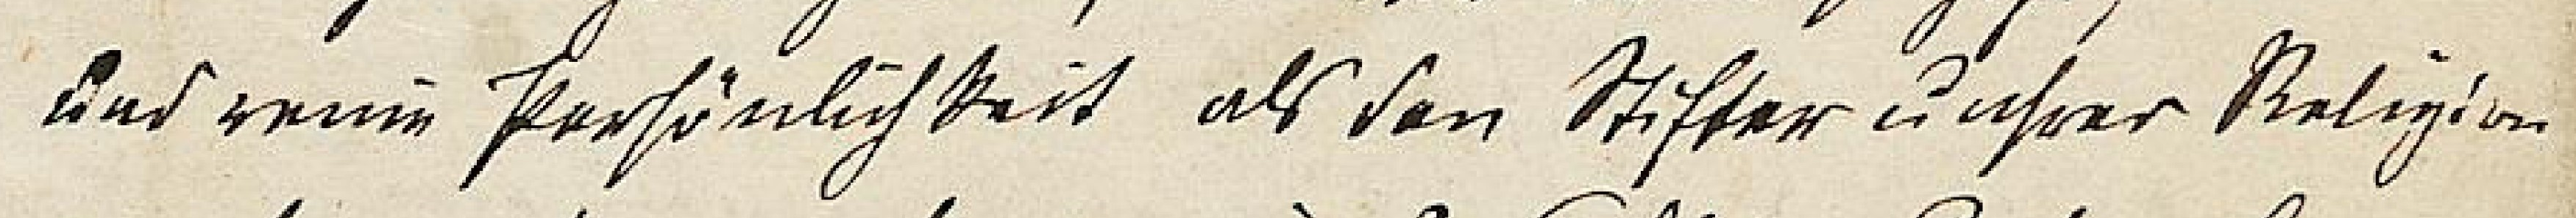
und reine Persönlichkeit als den Stifter unserer Religion
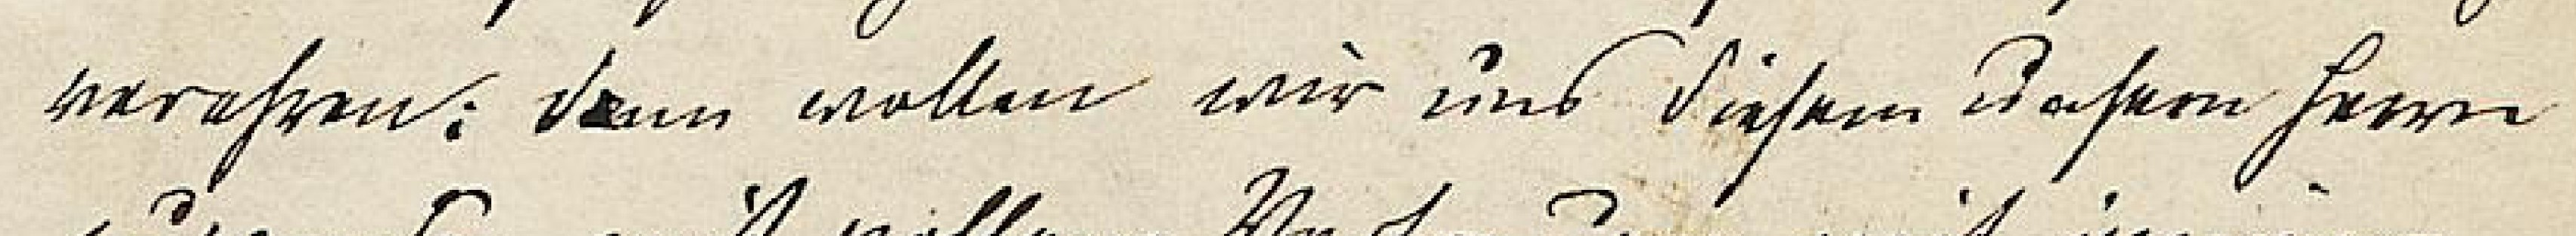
verehren: dann wollen wir uns diesem unserm Herrn
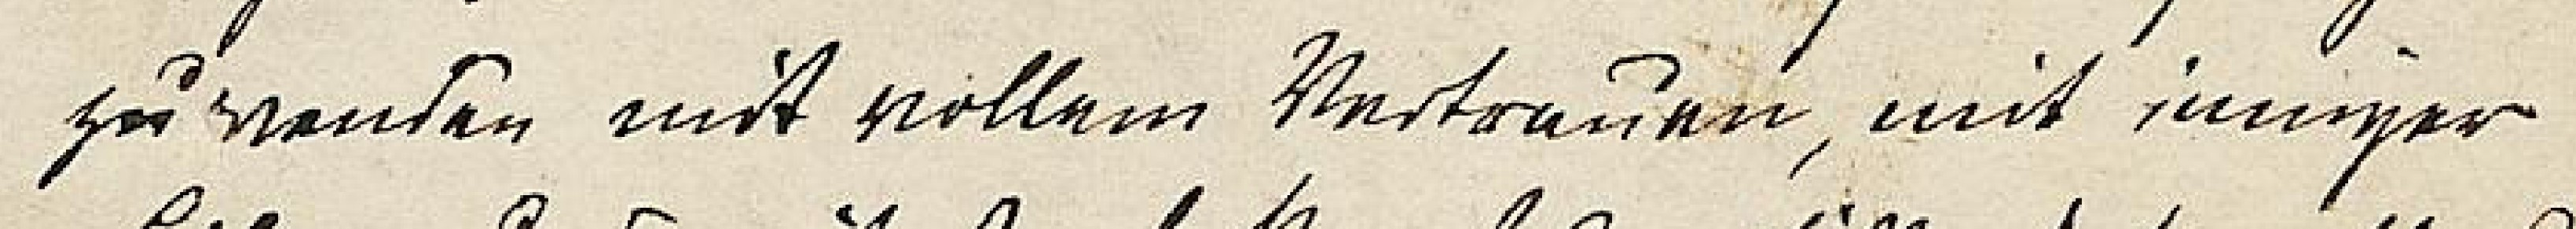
zuwenden mit vollem Vertrauen, mit inniger
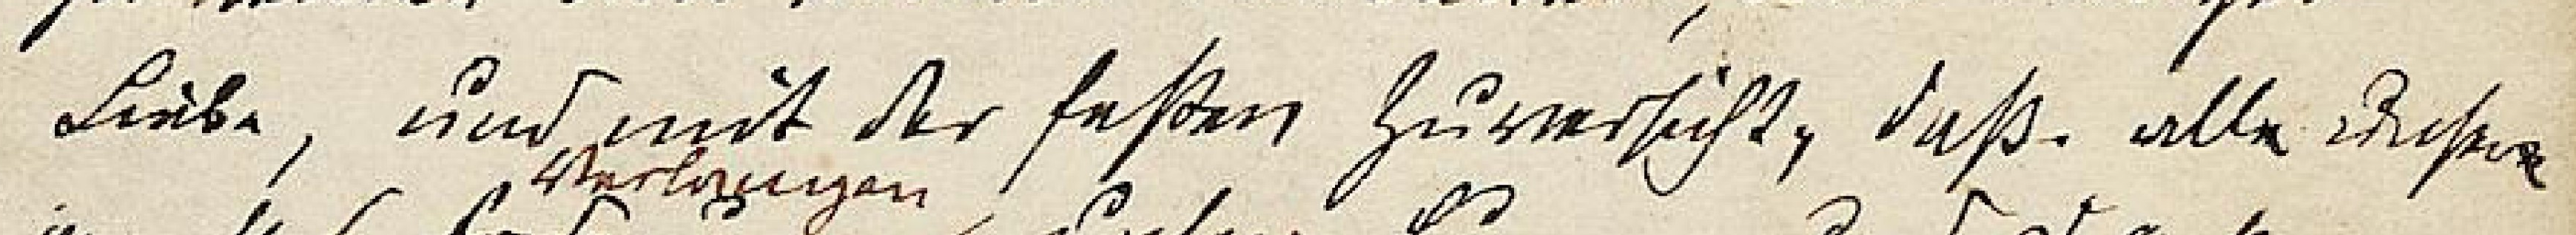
Liebe, und mit der festen Zuversicht, daß alle unsre
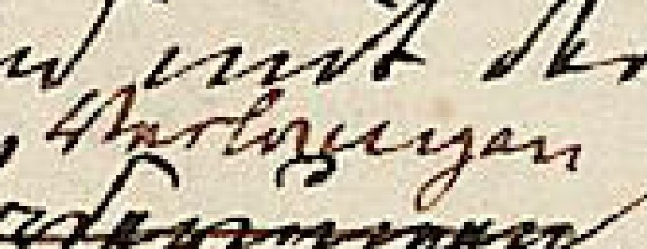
Verlangen
